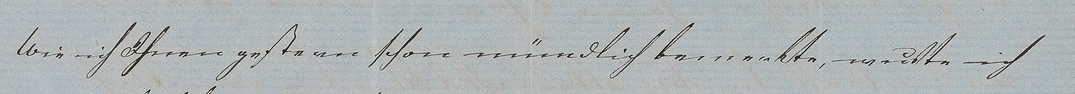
Wie ich Ihnen gestern schon mündlich berichtete, wußte ich
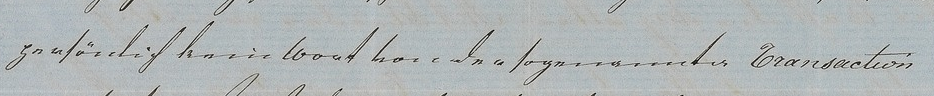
persönlich kein Wort von der sogenannten Transaction
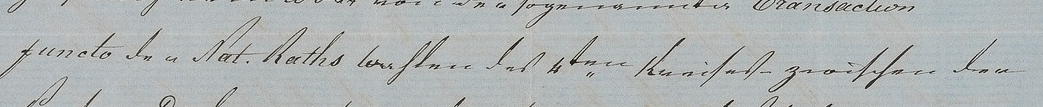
puncto den Nat.Raths Wahlen des 4ten Kreises – zwischen der
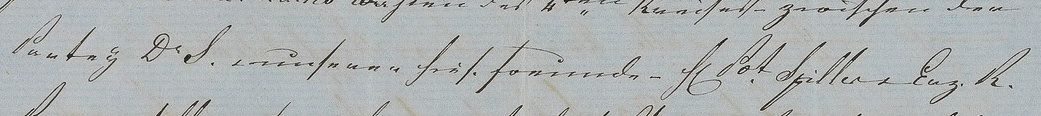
Partey DrS. & unserer hies. Freunde – Herr PntSpiller & Erz.R.
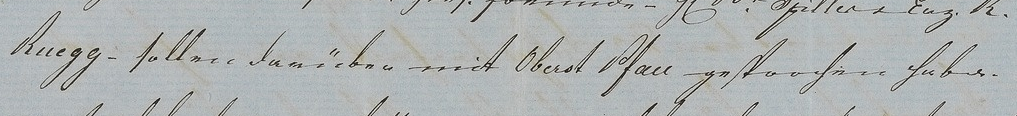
Ruegg – sollen darüber mit Oberst Pfau gesprochen haben,
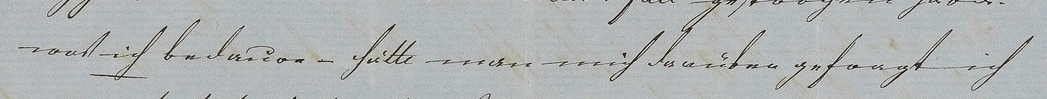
was ich bedaure – hätte man mich darüber gefragt ich
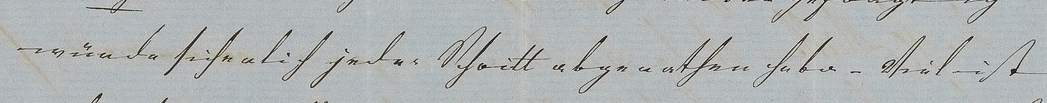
würde sicherlich jeden Schritt abgerathen haben – Viel ist
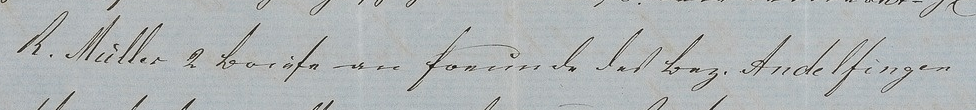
R. Müller 2 Briefe an Freunde des Bez. Andelfingen
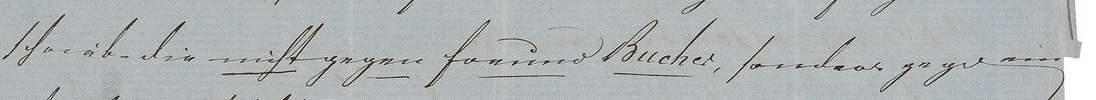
schrieb – die nicht gegen Freund Bucher, sondern gegen ein
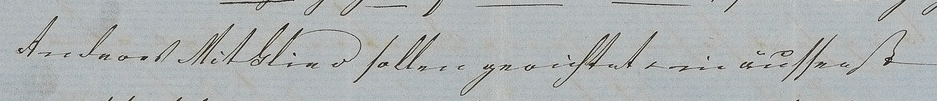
Anderes MitGlied sollen gerichtet & in äusserst
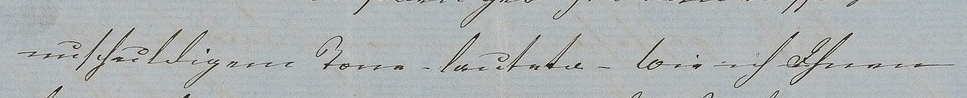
unschuldigem Tone – lauteten – Wie ich Ihnen
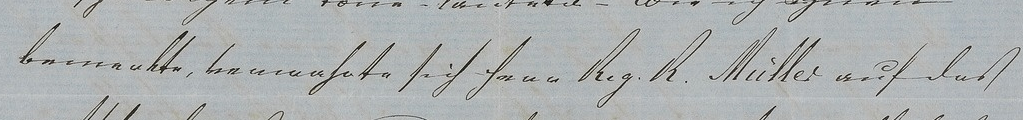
bemerkte, verwehrte sich Herr Reg.R. Müller auf das
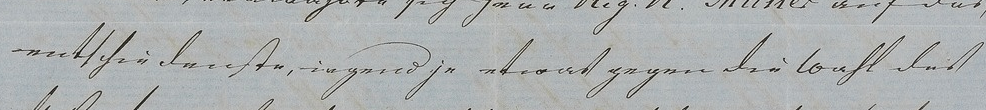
entschiedenste, irgend je etwas gegen die Wahl des
